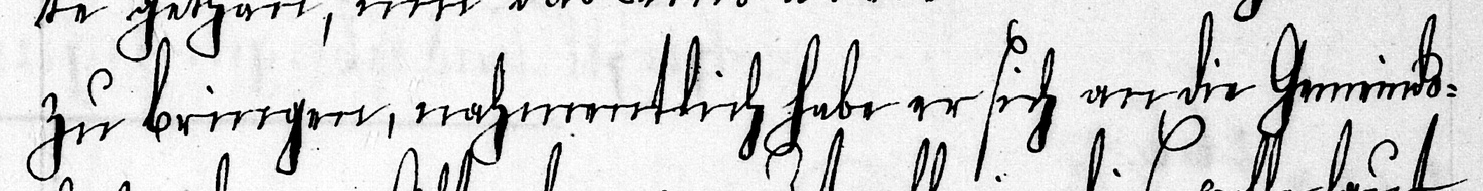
zu bringen, nahmentlich habe er sich an die Gemeinds¬
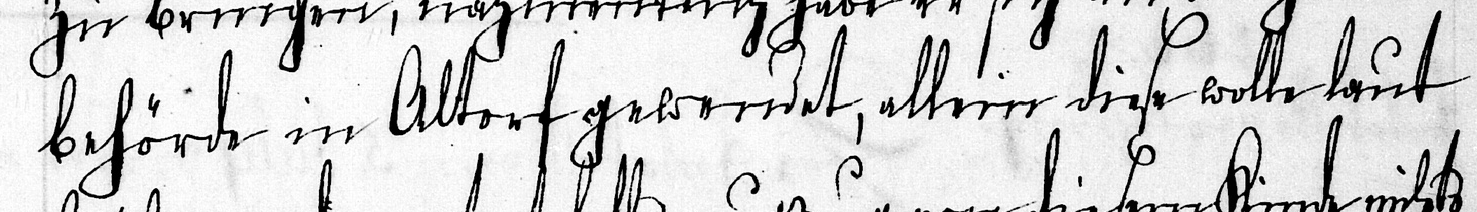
behörde in Altorf gewendet, allein diese wolle laut
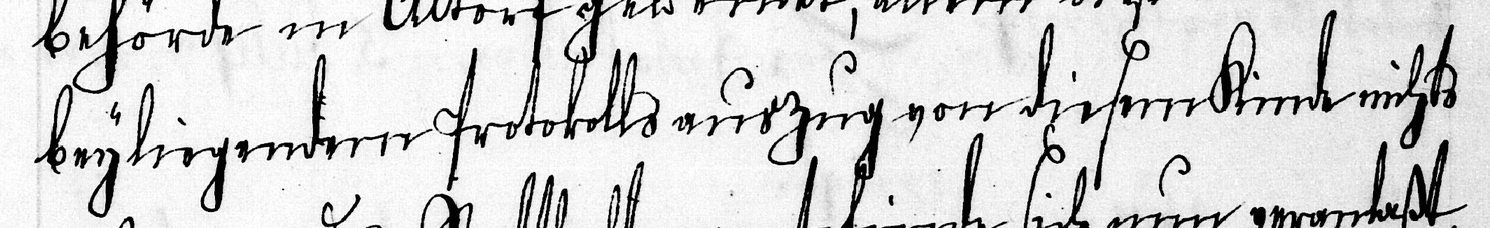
beyliegendem Protokollsauszug von diesem Kinde nichts
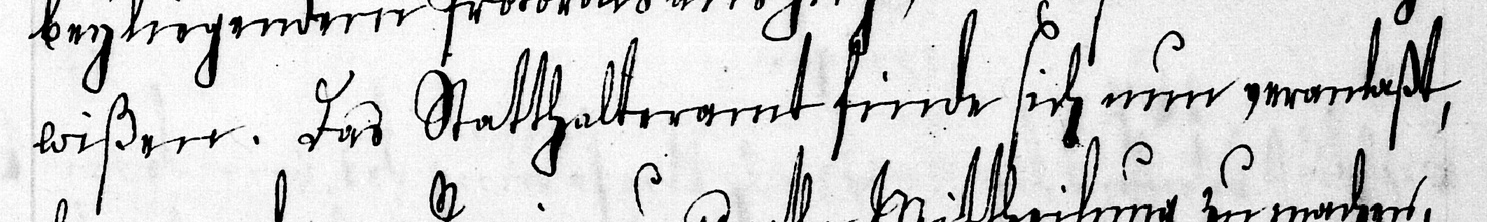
wißen. Das Statthalteramt finde sich nun veranlaßt,
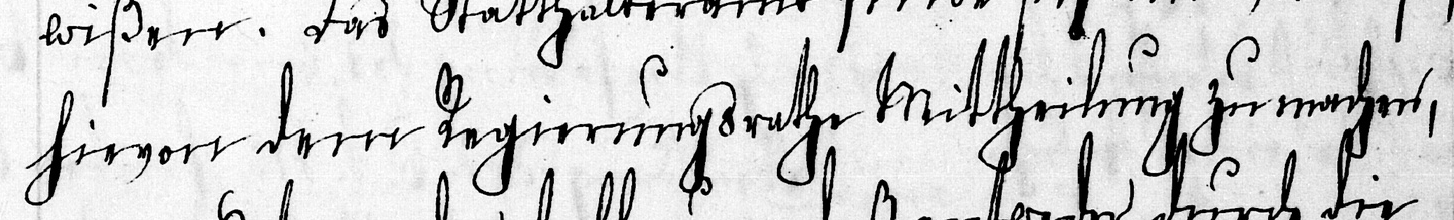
hievon dem Regierungsrathe Mittheilung zu machen,
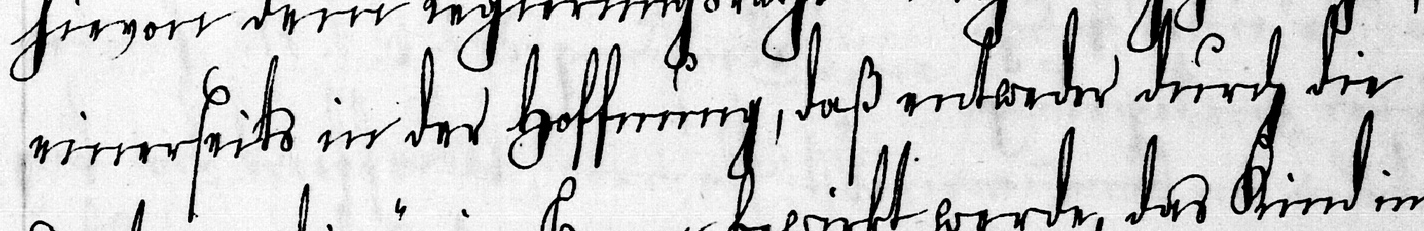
einerseits in der Hoffnung, daß entweder durch die
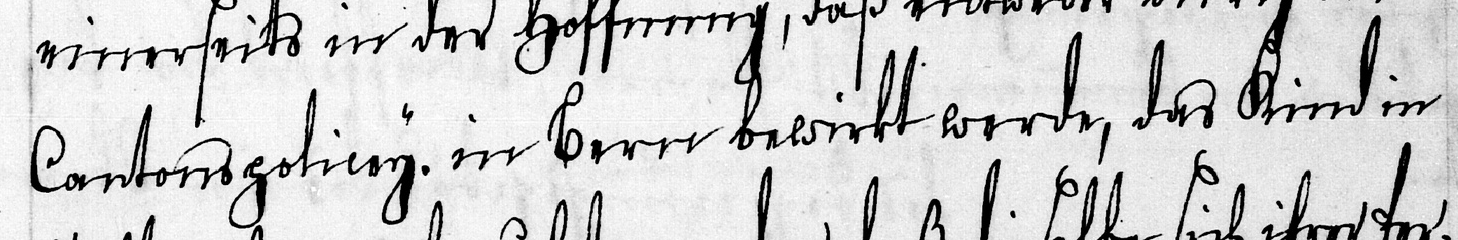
Cantonspolicey in Bern bewirkt werde, das Kind in
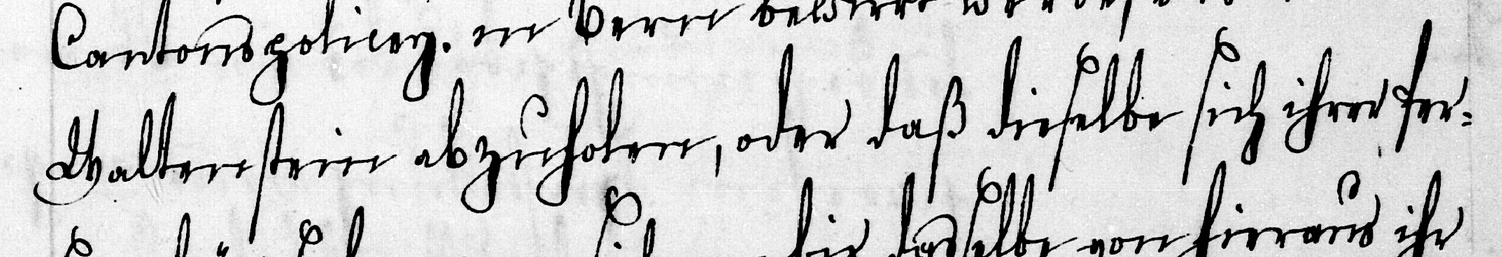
Waltenstein abzuholen, oder daß dieselbe sich ihrer Pe¬
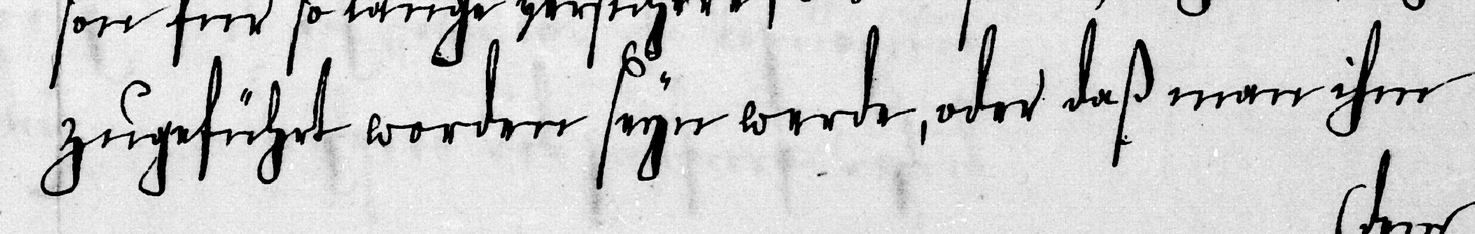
zugeführt worden seyn werde, oder daß man ihm
